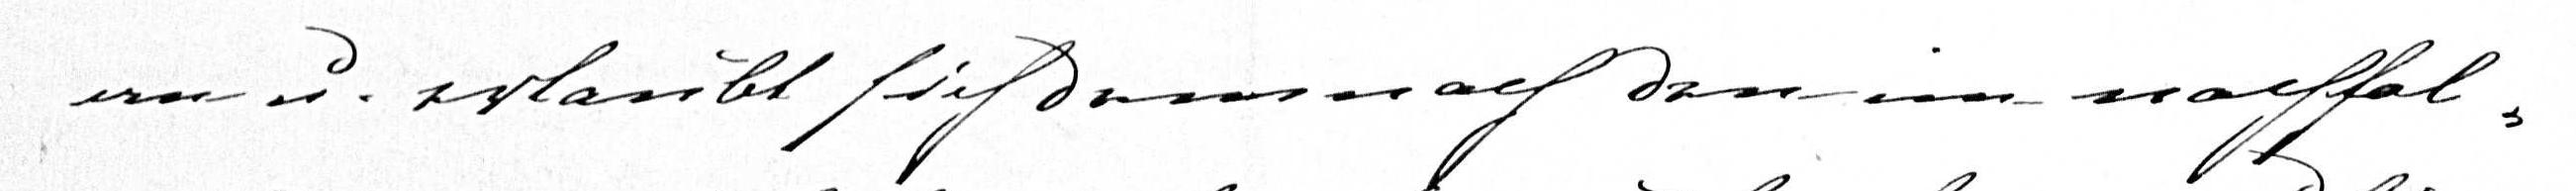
an u erlaubt sich demnach den im nachfol¬
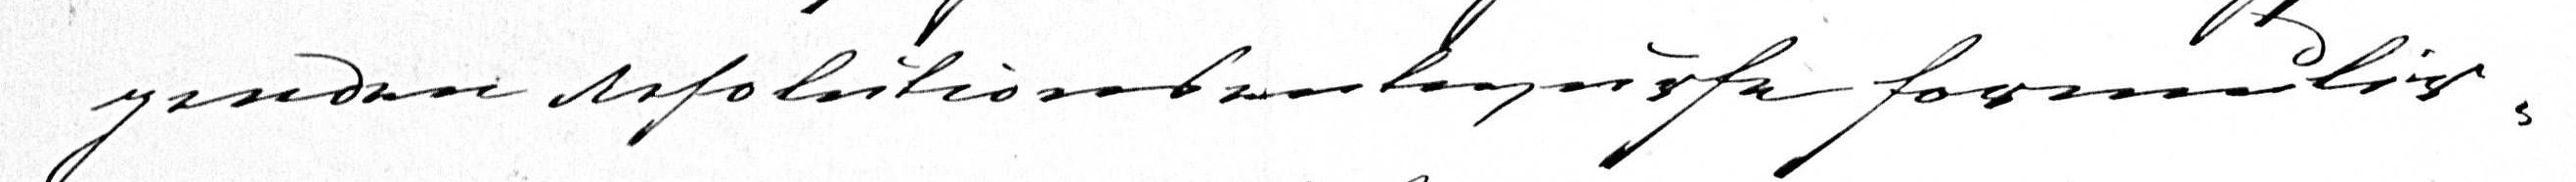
genden Resolutionsentwurfe formulir¬
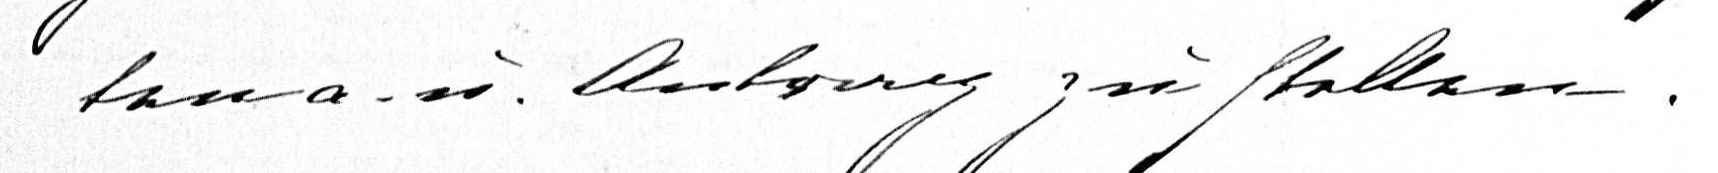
ten u. Antrag zu stellen.
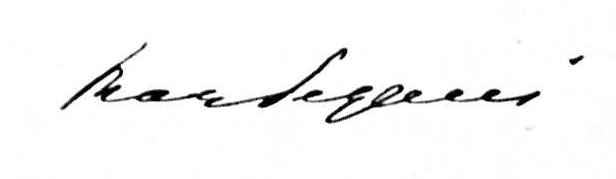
Mordeppeni
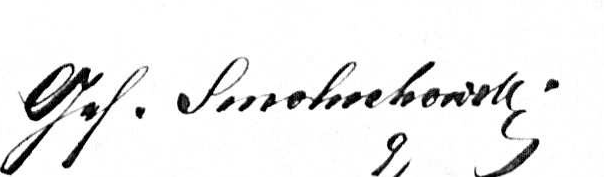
Grf Smolenkowitz
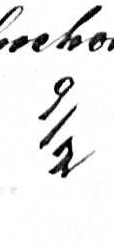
9/2
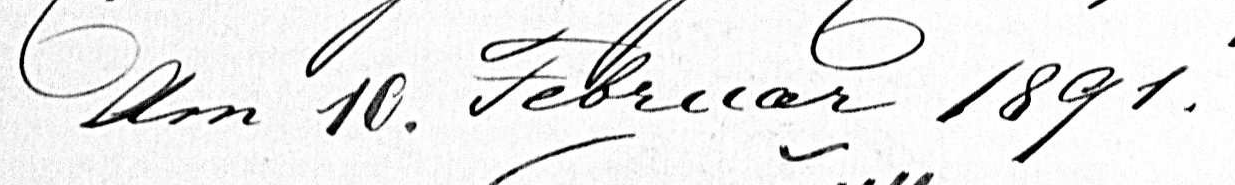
Am 10. Februar 1891
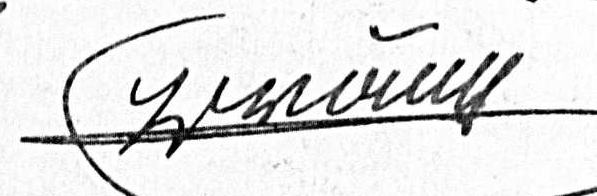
Wrany
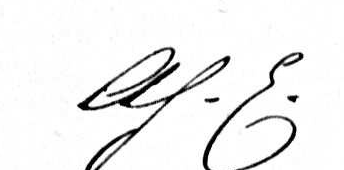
AhE
